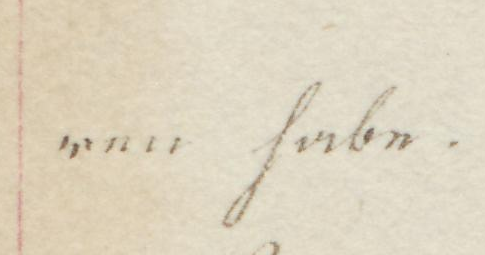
ren habe.
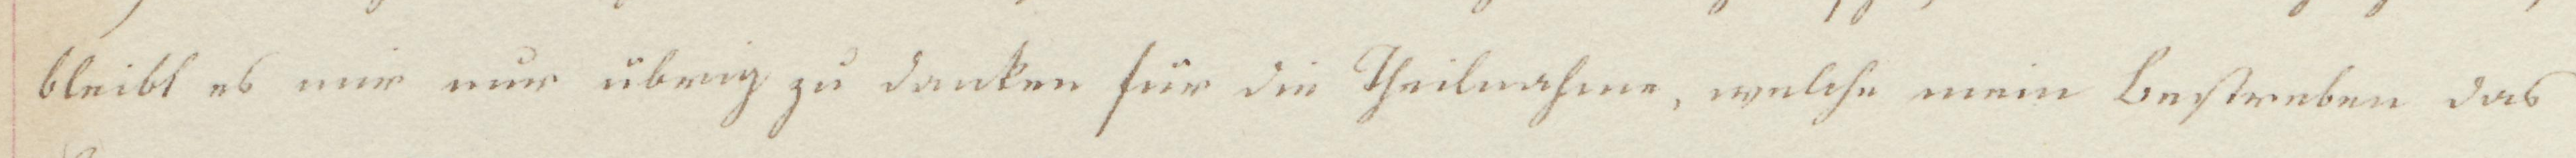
bleibt es mir nur übrig zu danken für die Theilnahme, welche mein Bestreben das
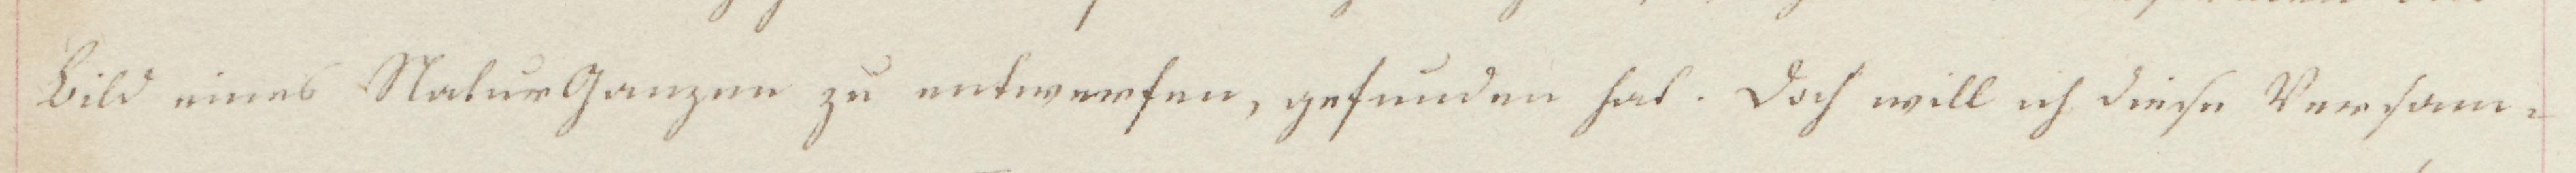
Bild eines NaturGanzen zu entwerfen, gefunden hat. Doch will ich diese Versam-
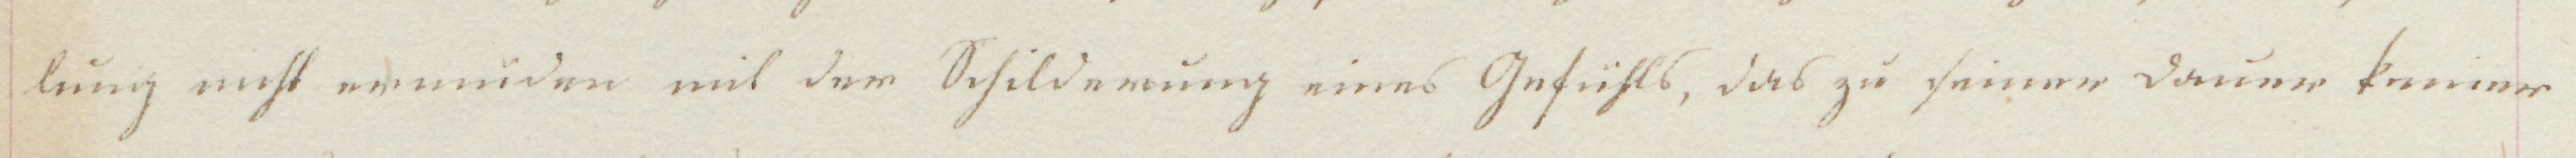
lung nicht ermüden mit der Schilderung eines Gefühls, das zu seiner Dauer keiner
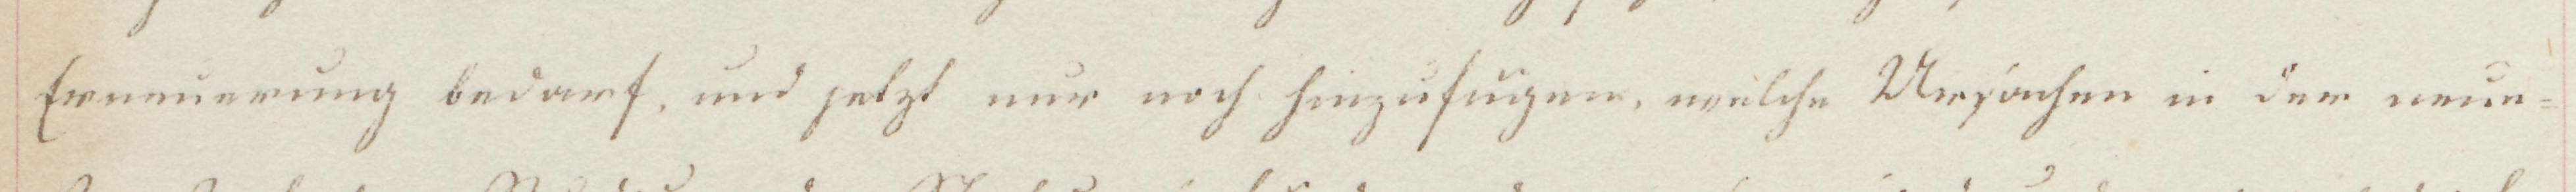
Erneuerung bedarf, und jetzt nur noch hinzufügen, welche Ursachen in der neue-
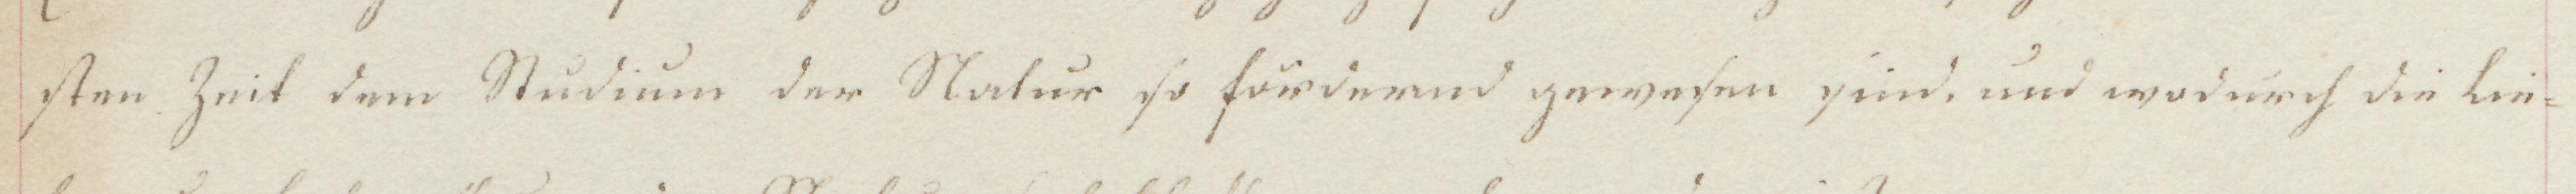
sten Zeit dem Studium der Natur so fördernd gewesen sind, und wodurch die Lie-
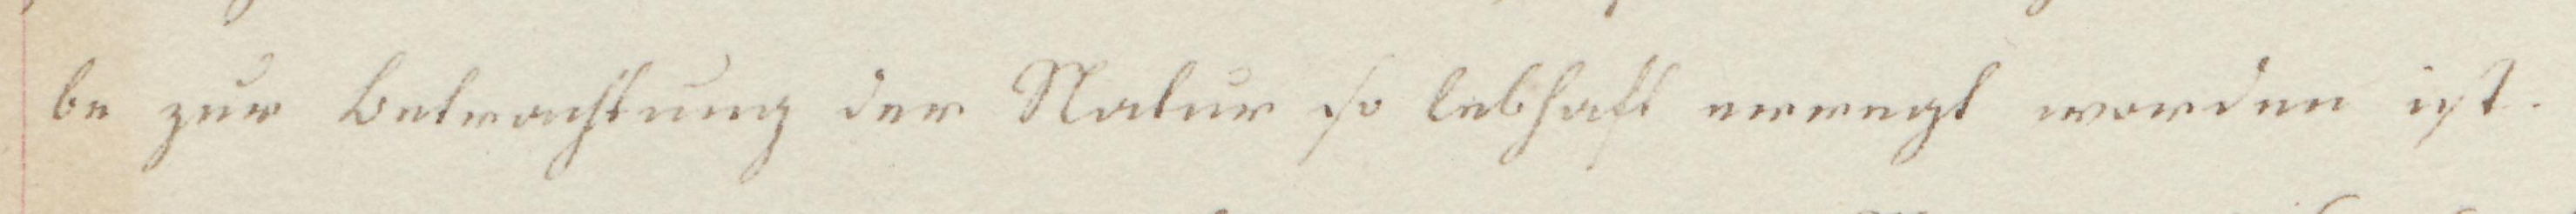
be zur Betrachtung der Natur so lebhaft erregt worden ist.
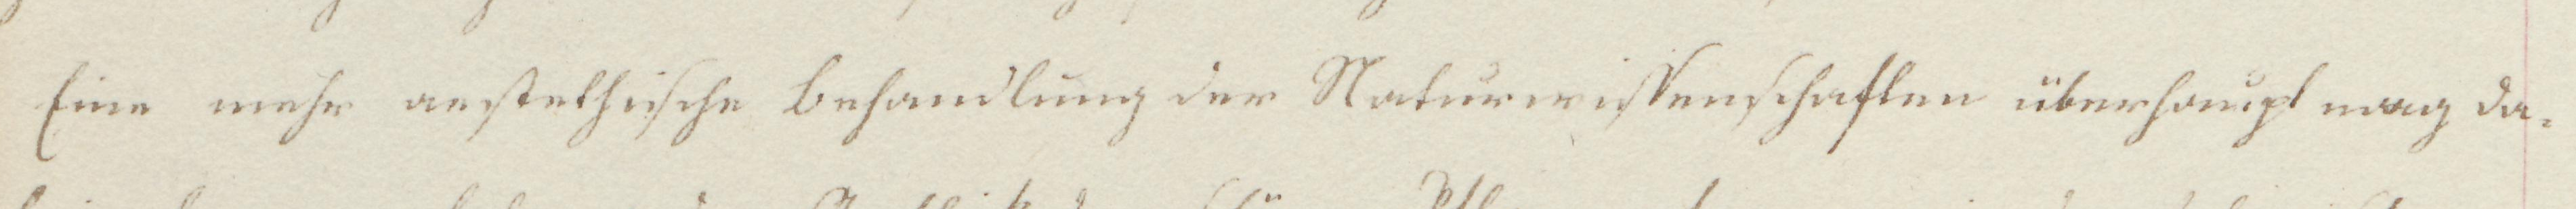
Eine mehr aestethische Beschreibung der Naturwissenschaften überhaupt mag da-
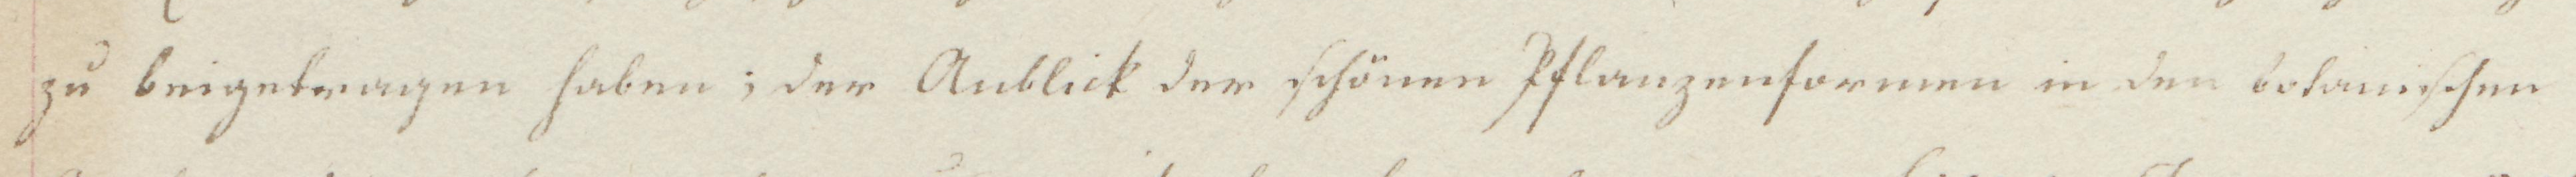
zu beigetragen haben; der Anblick der schönen Pflanzenformen in den botanischen
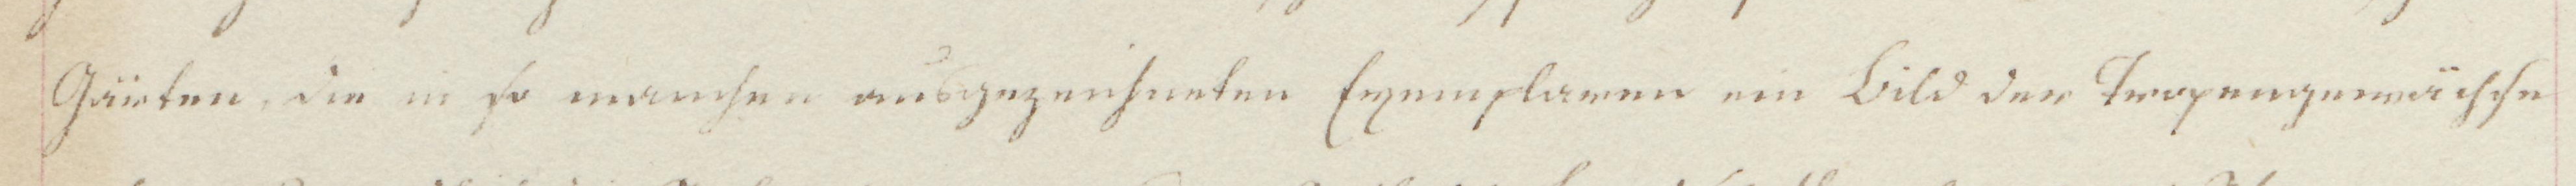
Gärten, die in so manchen ausgezeichneten Exemplaren ein Bild der Tropengewächse
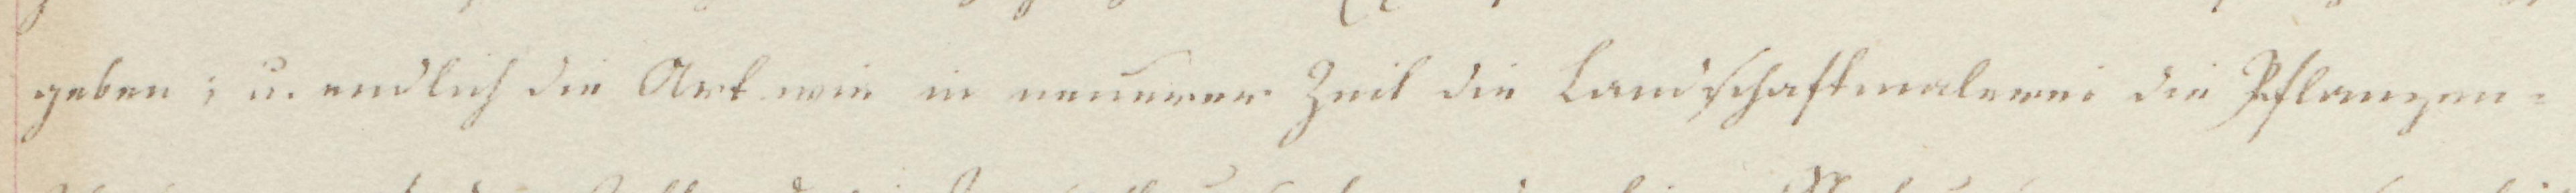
geben; u. endlich die Art wie in neuerer Zeit die Landschaftmalerei die Pflanzen-
